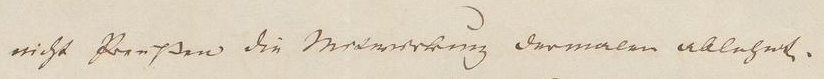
nicht Preußen die Mitwirkung dermalen ablehnt.
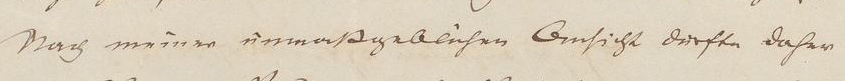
Nach meiner unmaßgeblichen Ansicht dürfte daher
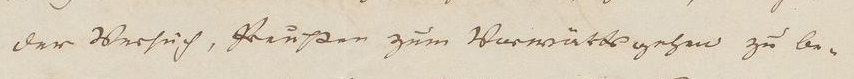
der Versuch, Preußen zum Vorwärtsgehen zu be-
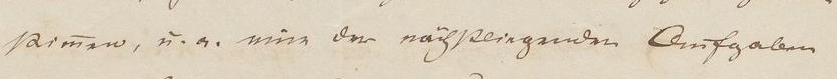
stimmen, u. a. eine der nächstliegenden Aufgaben
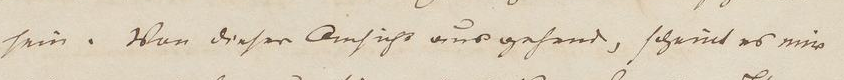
sein. Von dieser Ansicht ausgehend, scheint es mir
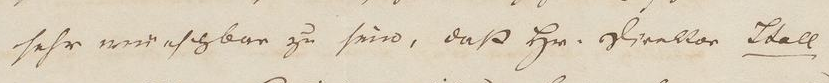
sehr wünschbar zu sein, daß Hr. Direktor Stoll
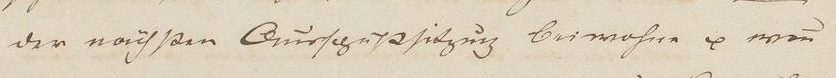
der nächsten Ausschußsitzung beiwohne & wenn
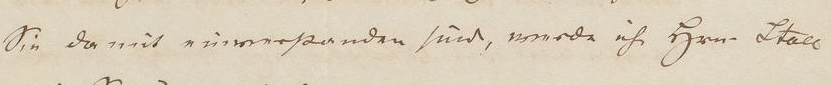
Sie damit einverstanden sind, werde ich Hrn. Stoll
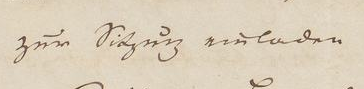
zur Sitzung einladen.
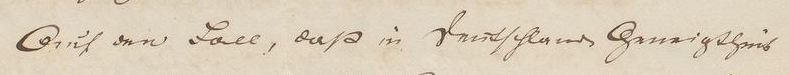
Auf den Fall, daß in Deutschland Geneigtheit
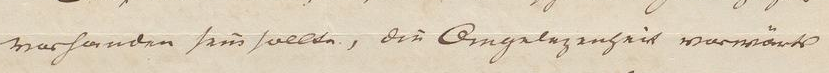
vorhanden sein sollte, die Angelegenheit vorwärts
